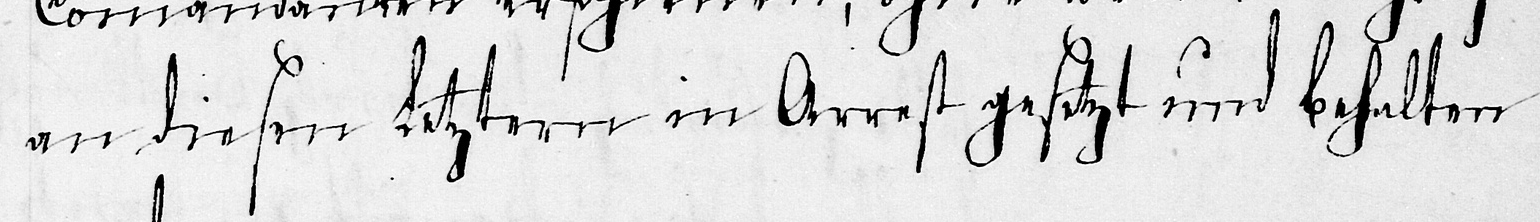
an diesen Letztern in Arrest gesetzt und behalten
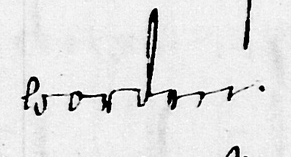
worden.
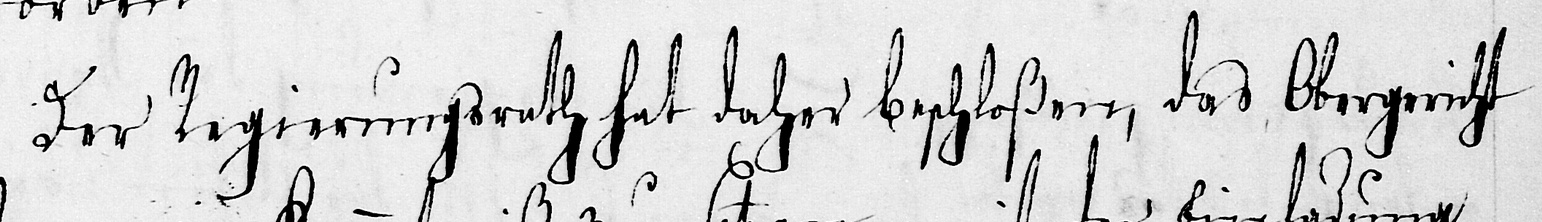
Der Regierungsrath hat daher beschloßen, das Obergericht
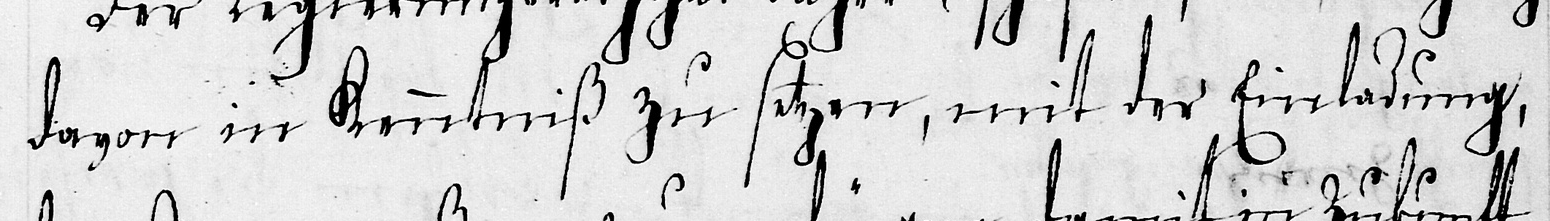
davon in Kenntniß zu setzen, mit der Einladung,
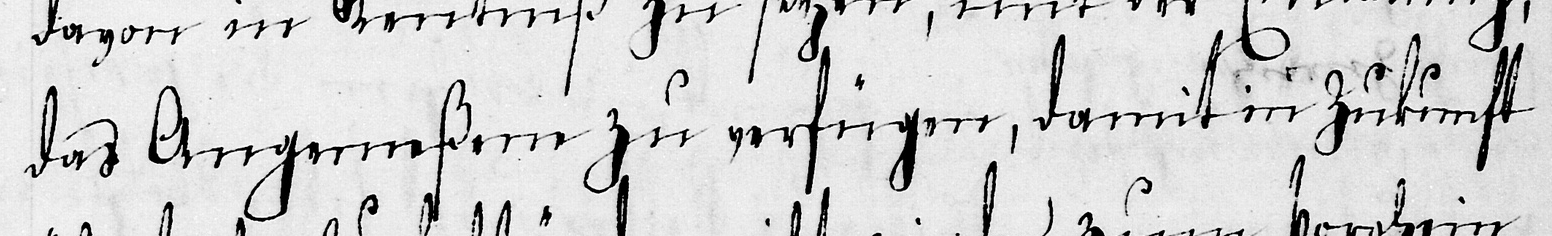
das Angemeßene zu verfügen, damit in Zukunft
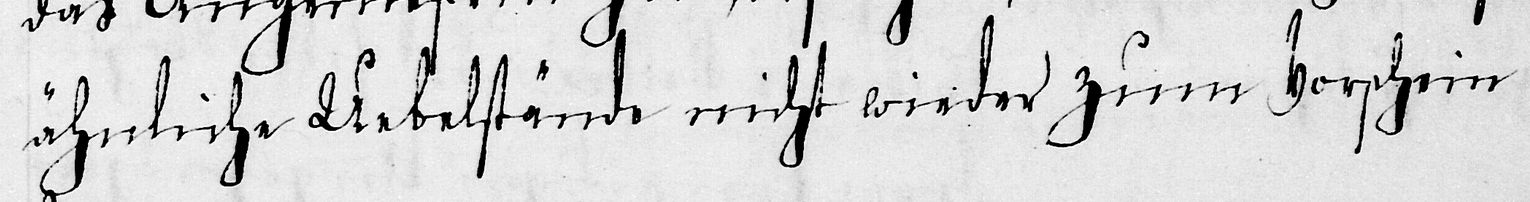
ähnliche Uebelstände nicht wieder zum Vorschein
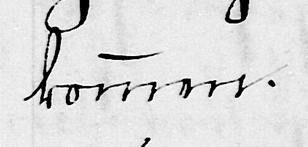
kommen.
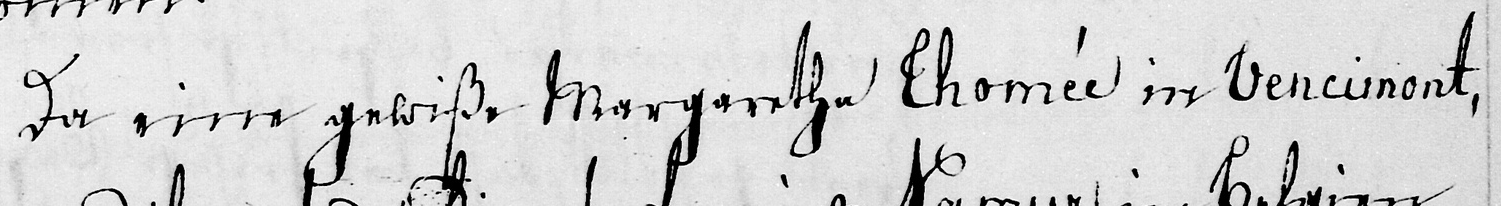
Da eine gewiße Margaretha Thomée in Vencimont,
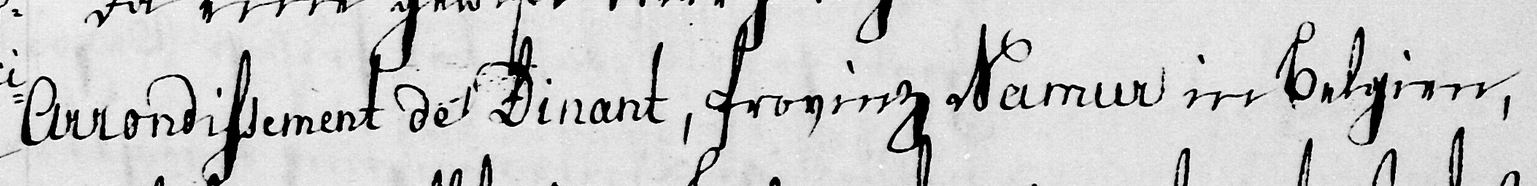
Arrondihsement de’ Dinant, Provinz Namur in Belgien,
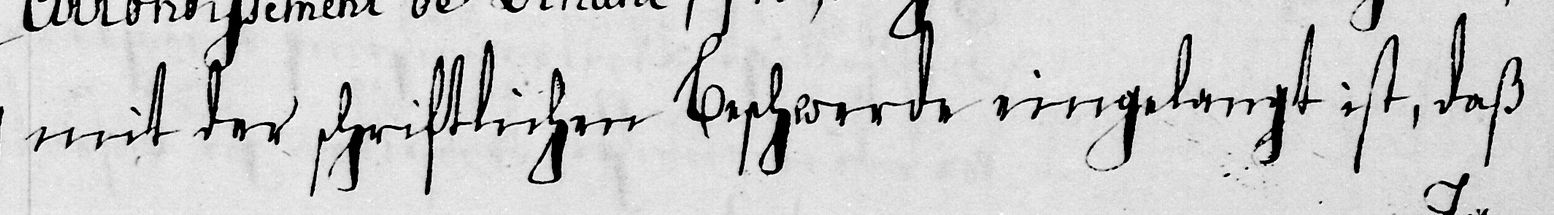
mit der schriftlichen Beschwerde eingelangt ist, daß
